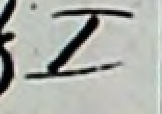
I
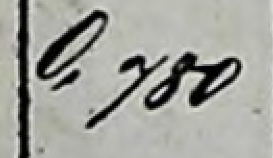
0,780
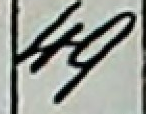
49
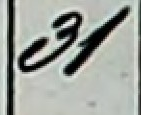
31
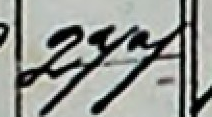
277
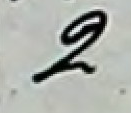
2
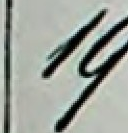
19
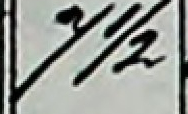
7 ½
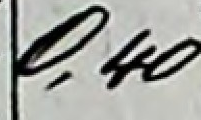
0,40
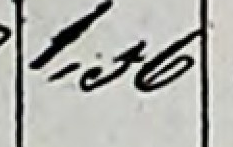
1,56
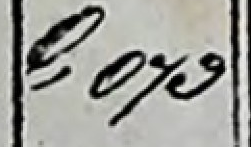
0,073
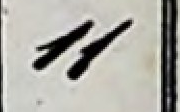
11
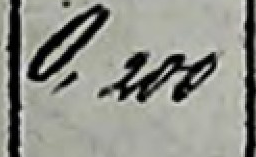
0,200
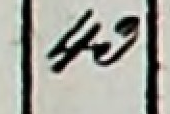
43
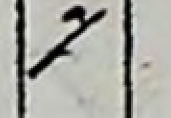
7
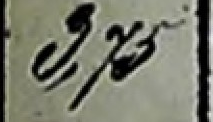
3,75
